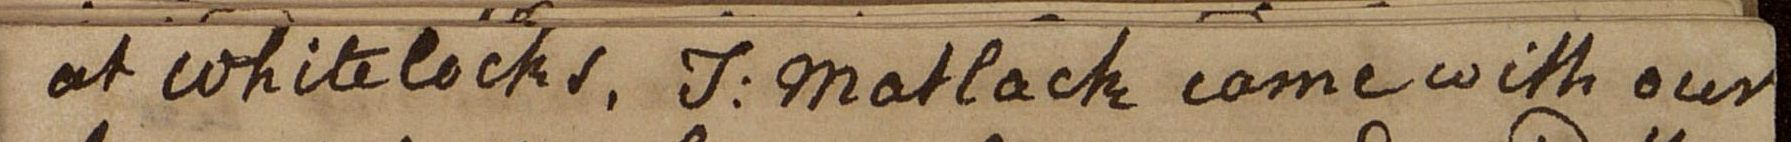at Whitelocks, T: Matlack came with our
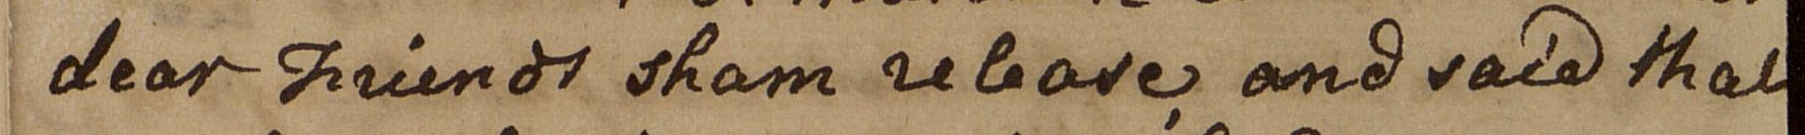dear Friends sham release, and said that
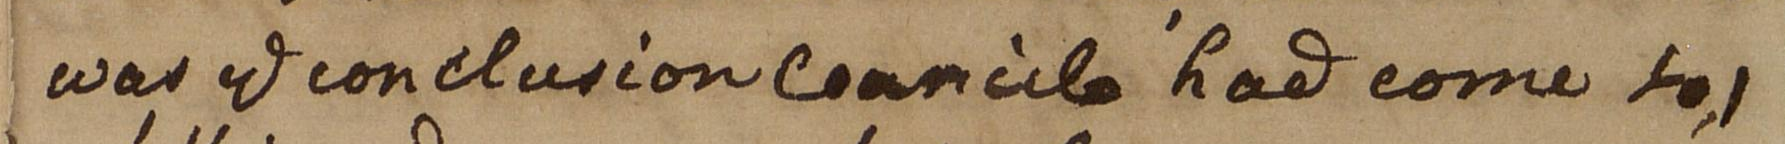was y^e conclusion Council had come to, I
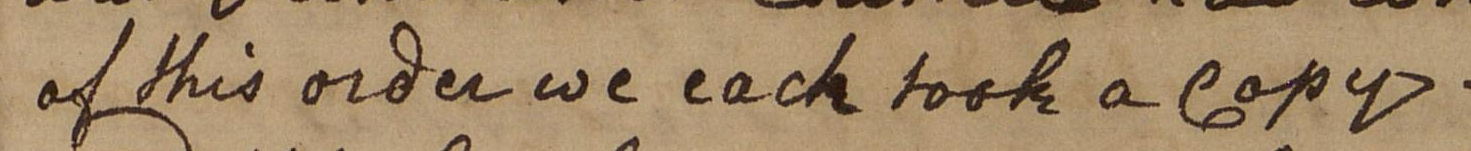of this order we each took a Copy
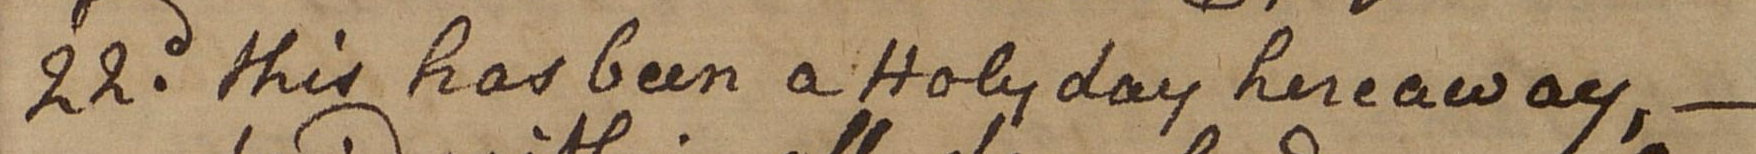22^d. this has been a Holy day hereaway,-
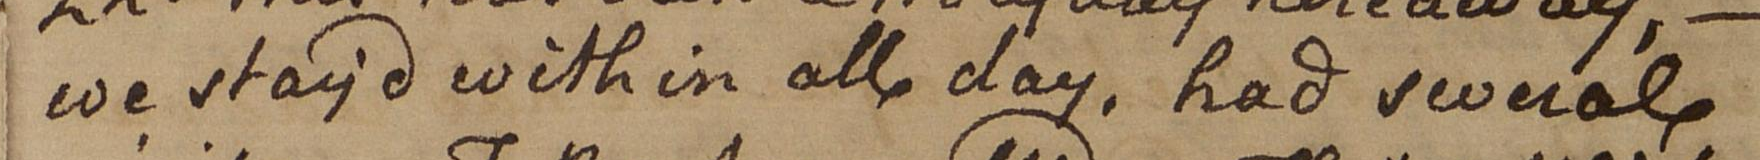we stay'd with in all day, had several
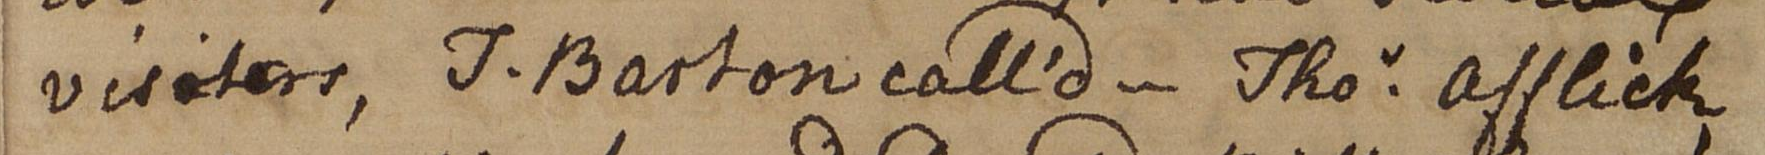visitors, T. Barton call'd- Tho^s. Afflick
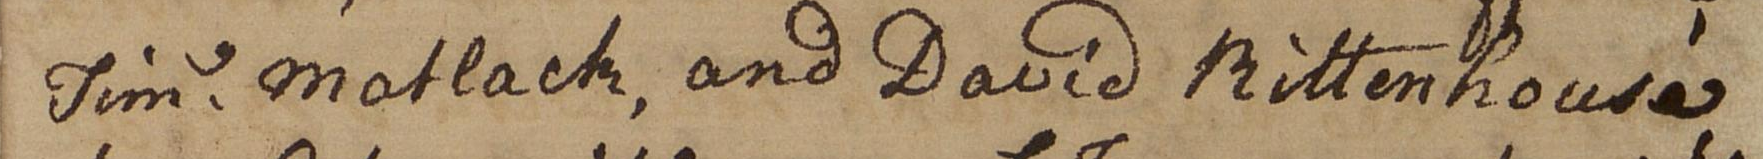Tim^y. Matlack, and David Rittenhouse
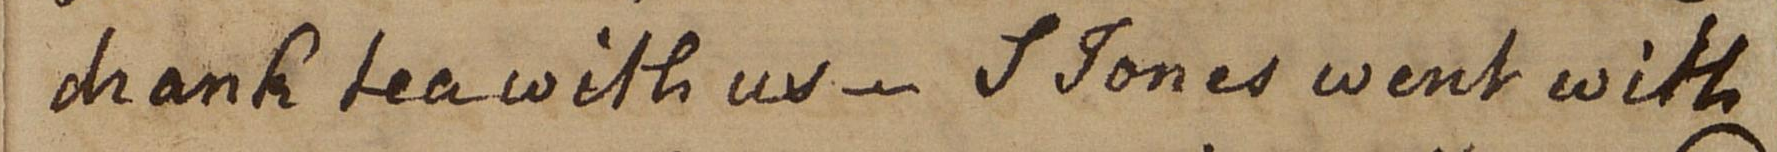drank tea with us- S Jones went with
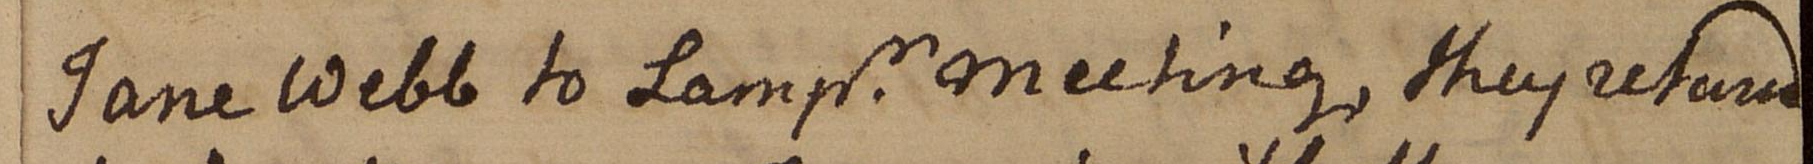Jane Webbs to Lamp^r. meeting, they returnd
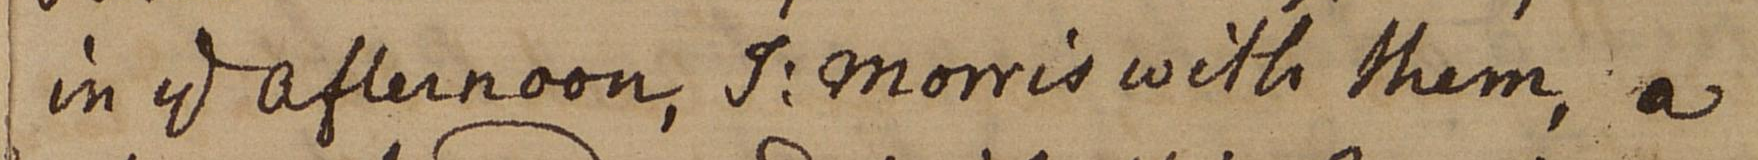in y^e afternoon, F: Morris with them, a
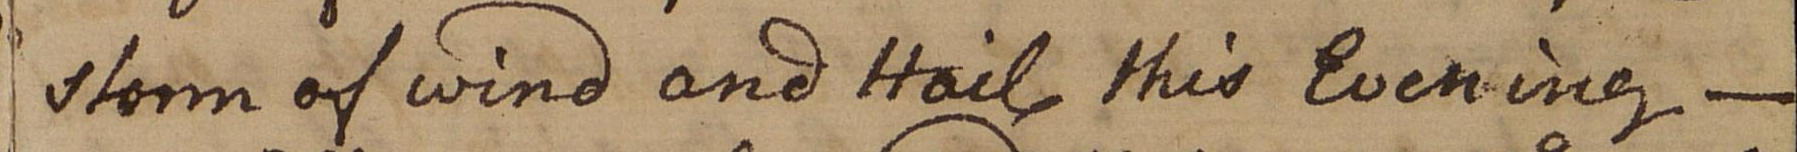storm of wind and Hail this Evening-
